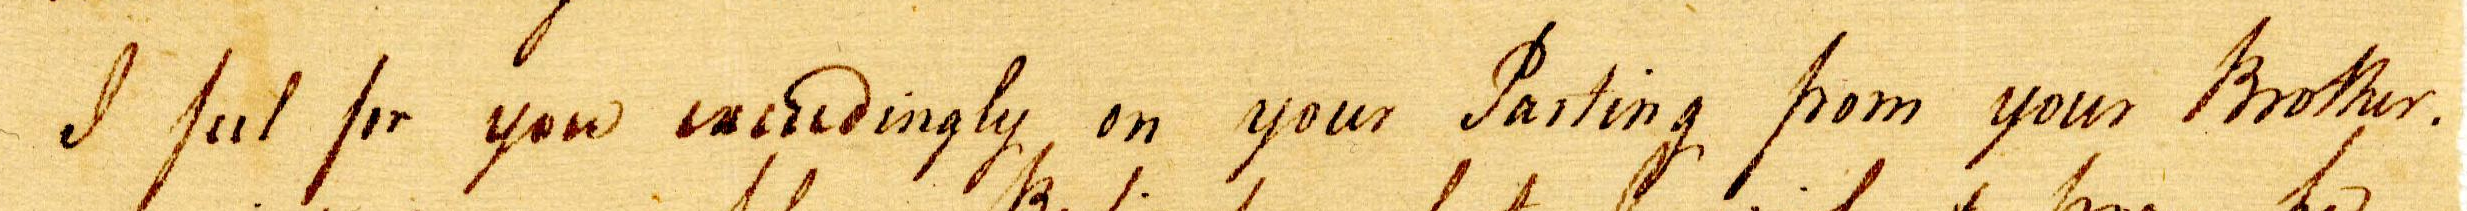I feel for you exceedingly on your Parting from your Brother.
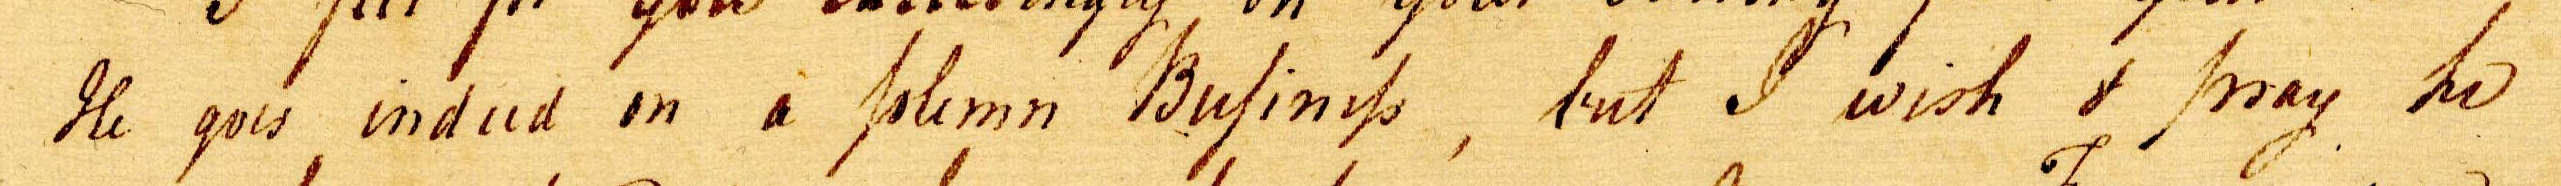He goes indeed on a solemn Business, but I wish & pray he
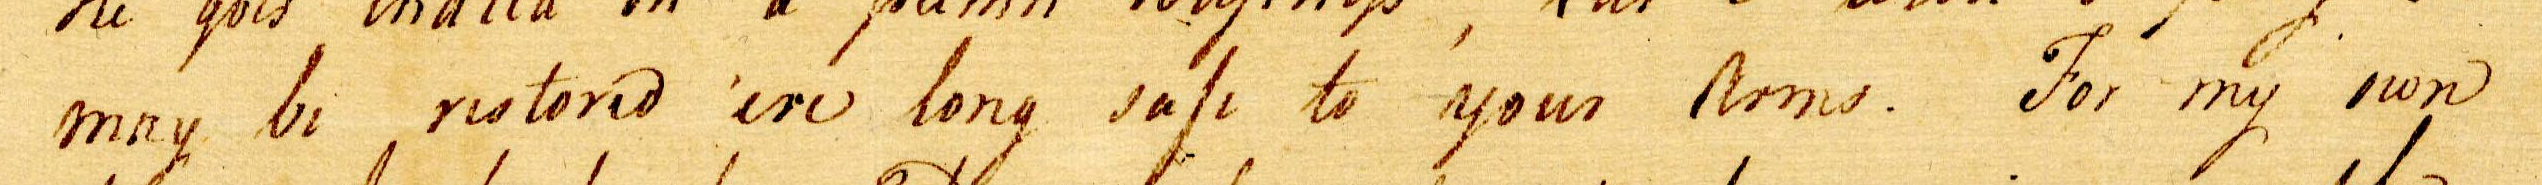may be restored ere long safe to your Arms. For my own
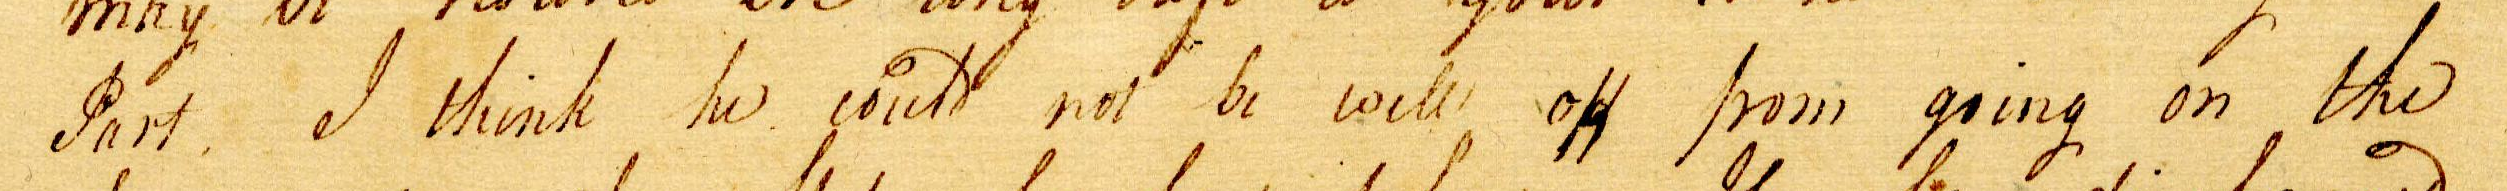Part, I think he could not be well off from going on the
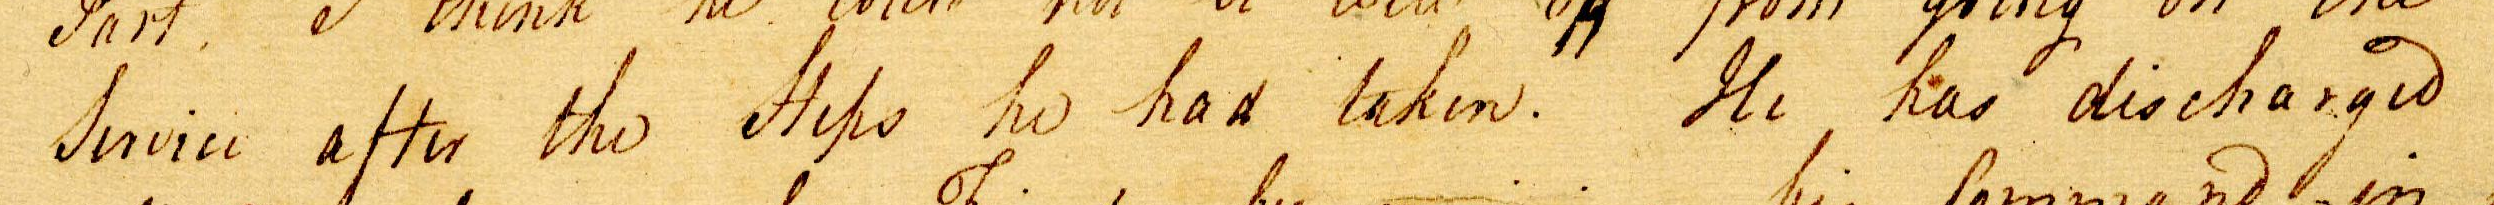Service after the Steps he had taken. He has discharged
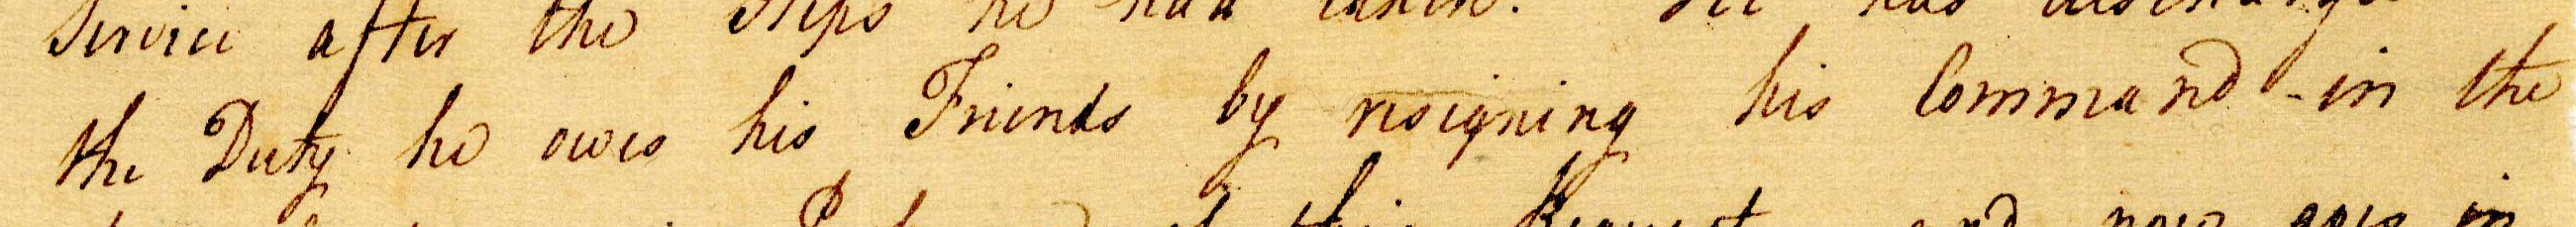the Duty he owes his Friends by resigning his Command in the
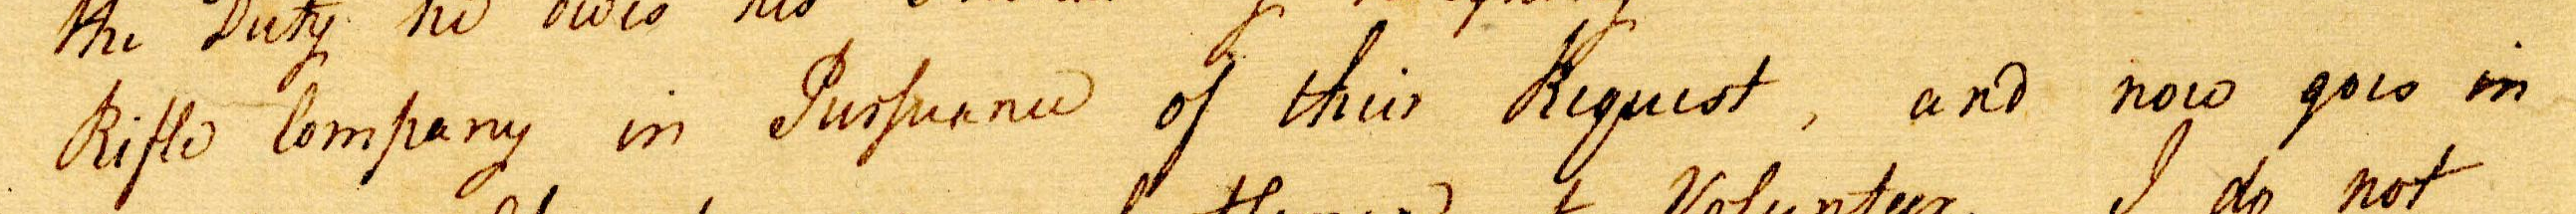Rifle Company in Pursuance of this Request, and now goes in
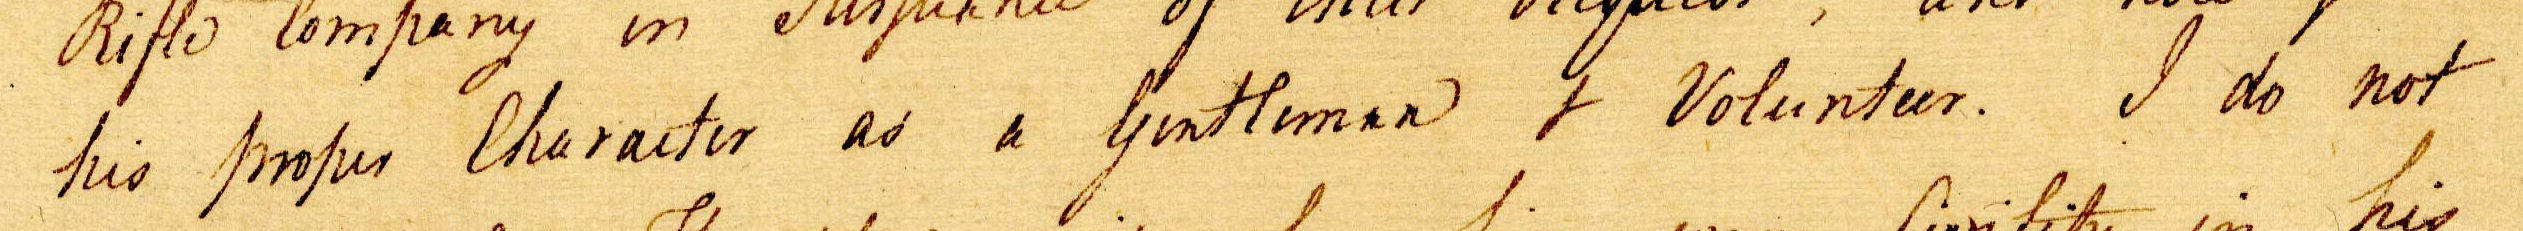his proper Character as a Gentleman & Volunteer. I do not
